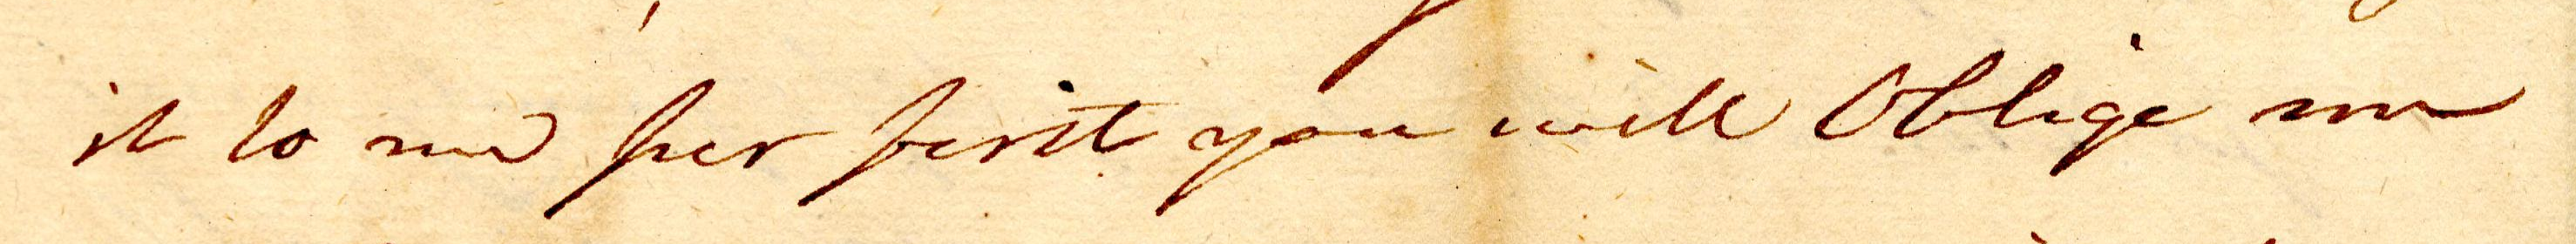it to me per first you will Oblige am
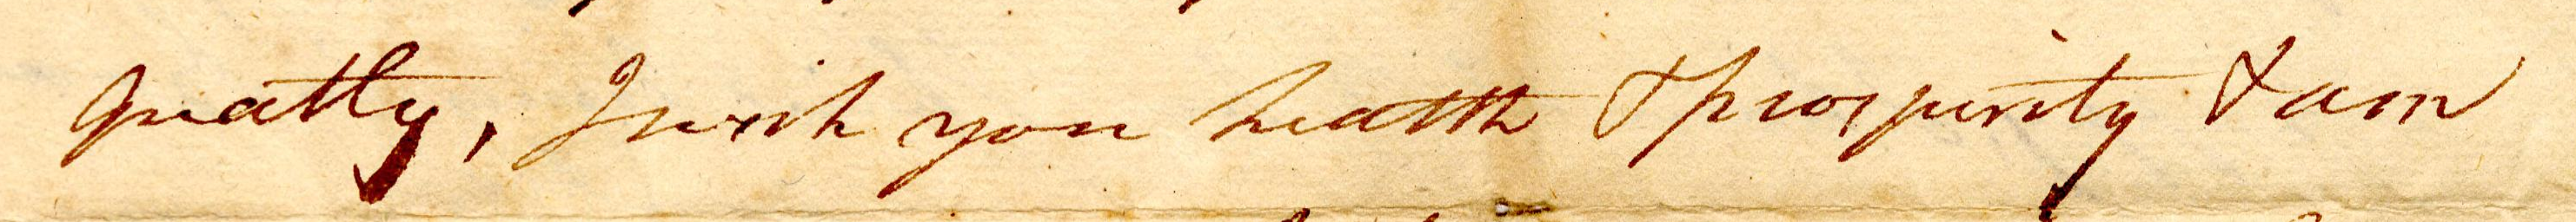greatly, I write you health & prosperity & am
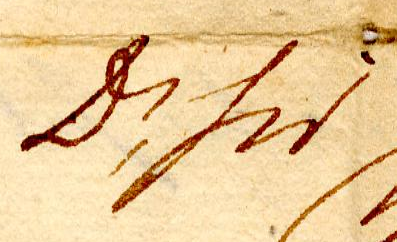D^r Sir
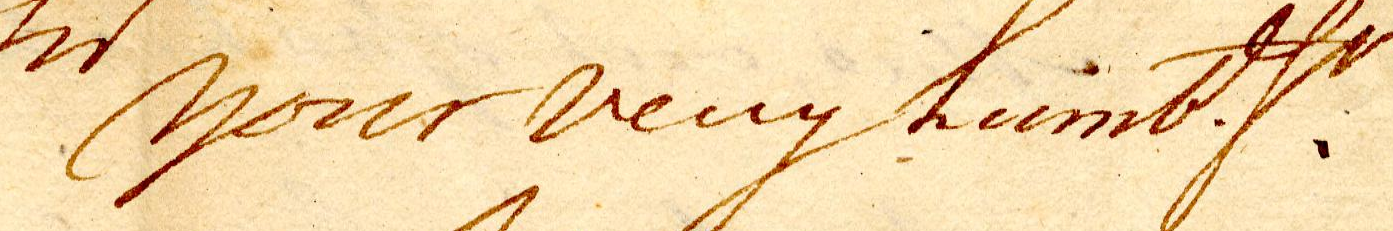your very humb^l. S^t.
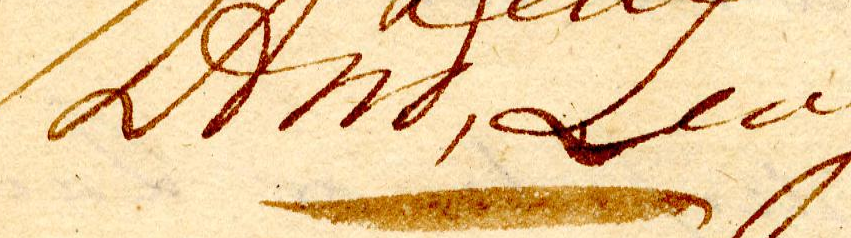And^rew Levy
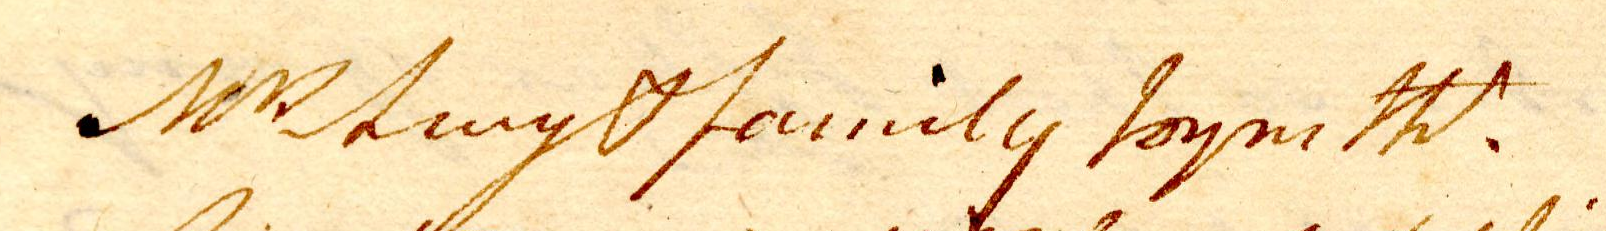M^rs. Lucy & family joyns th^r.
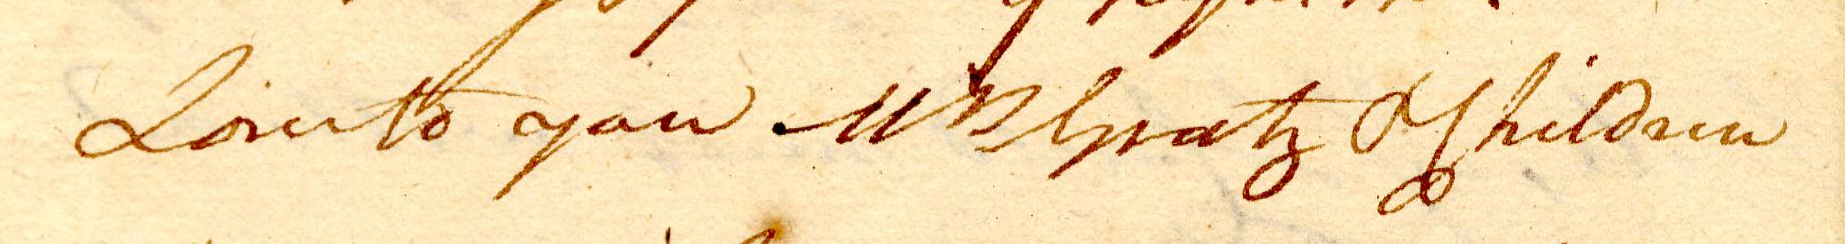love to M^rs Gratz & Children,
